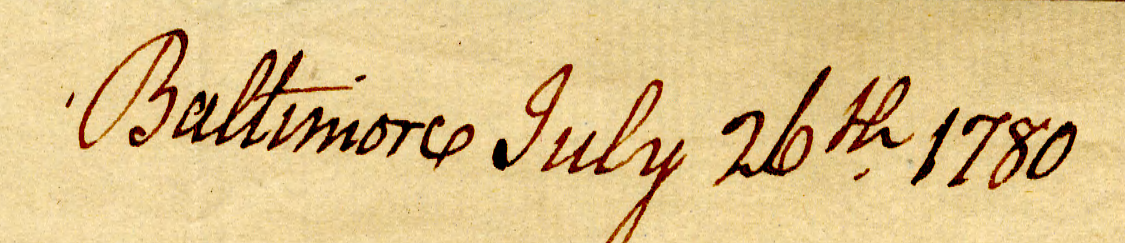Baltimore July 26^th. 1780
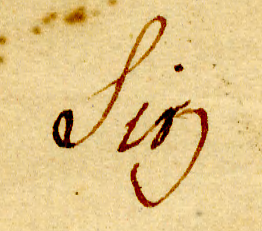Sir,
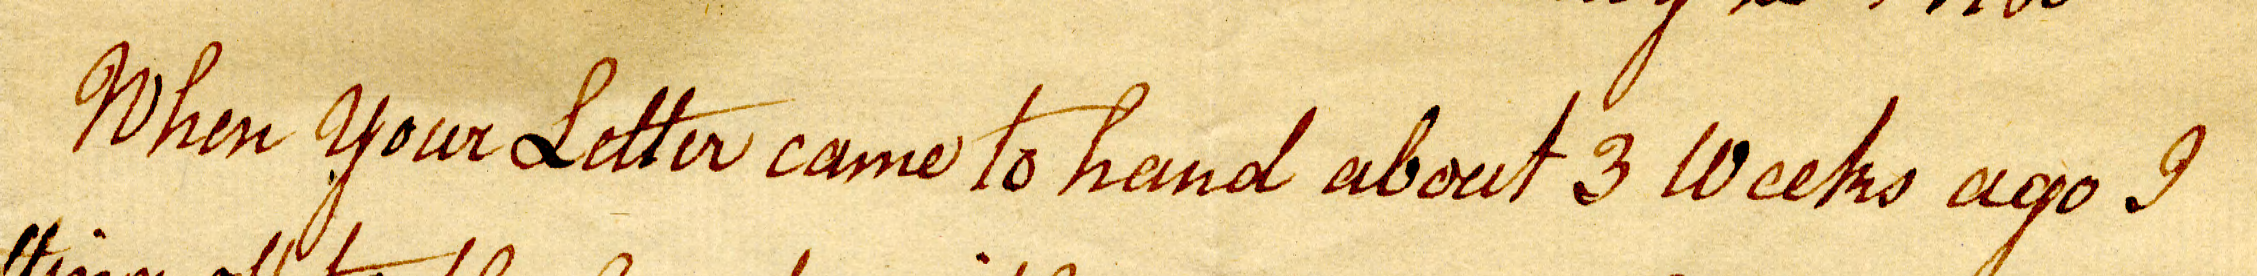When your Letter came to hand about 3 weeks ago I
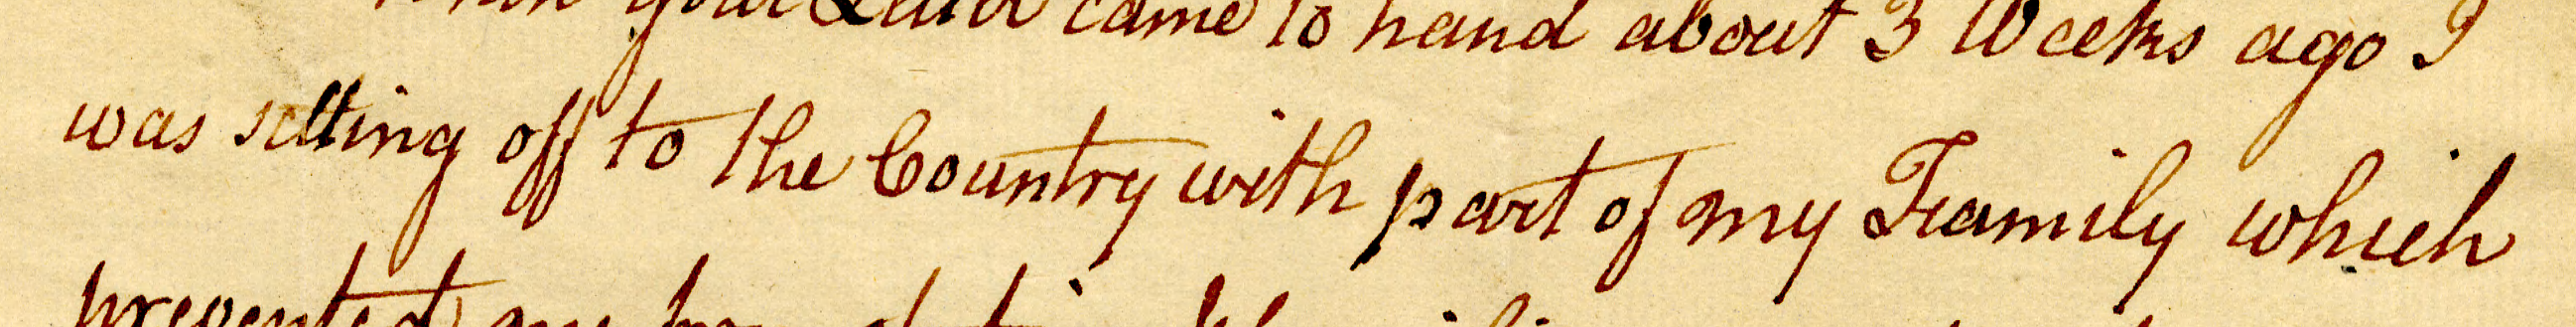was setting off to the country with part of my Family which
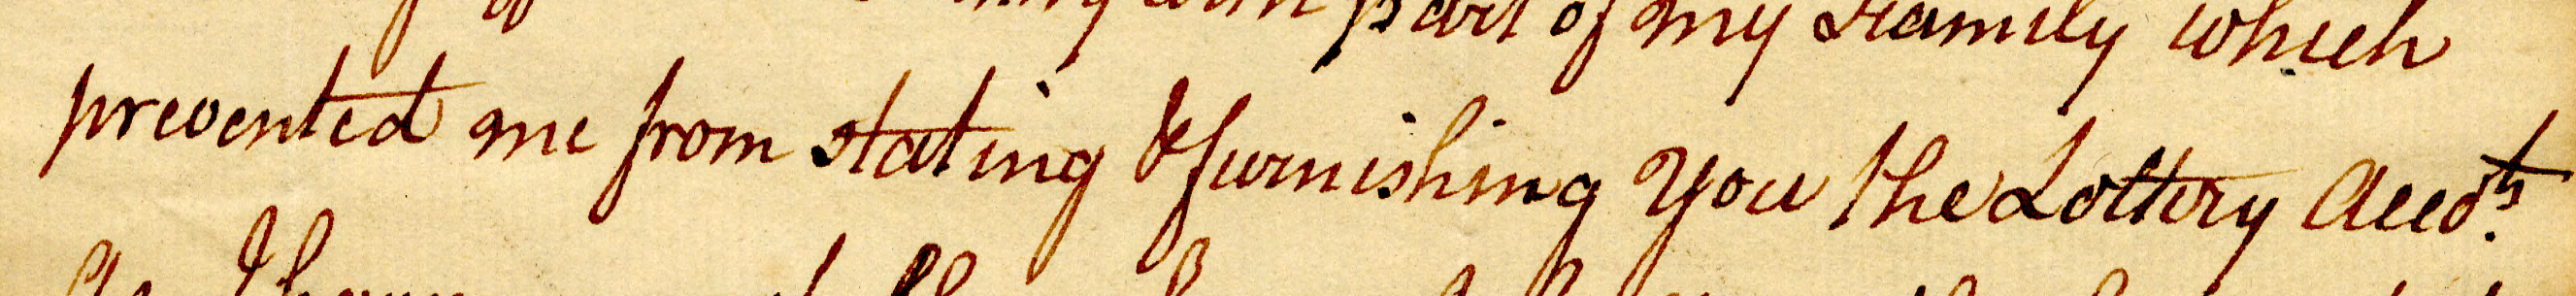prevented me from stating & furnishing you the Lottery Acco^ts.
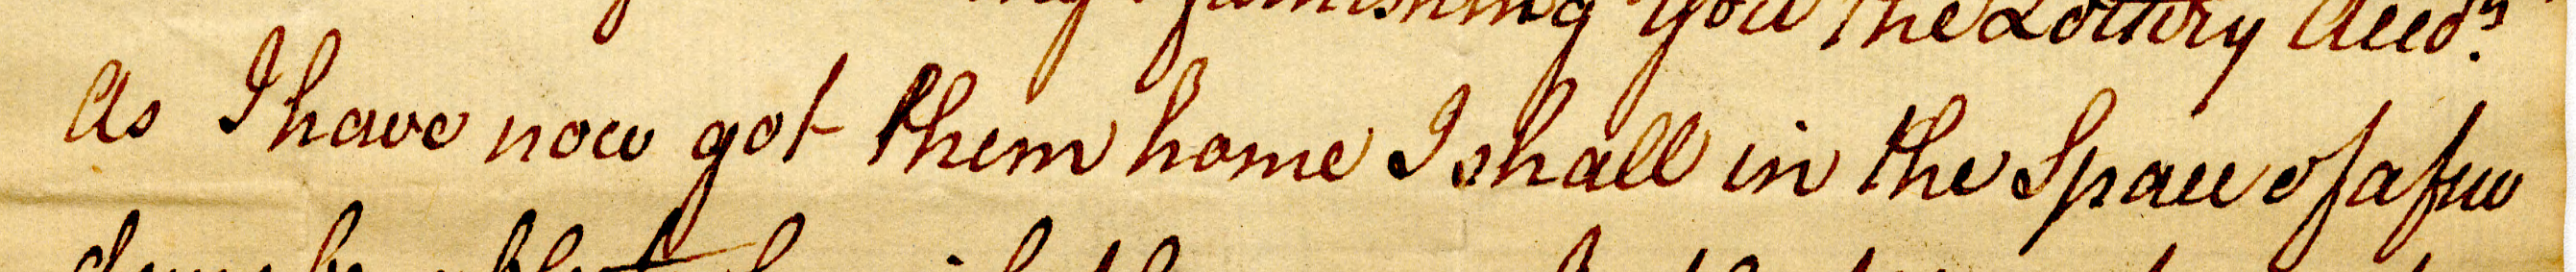as I have now got them home I shall in the space of a few
